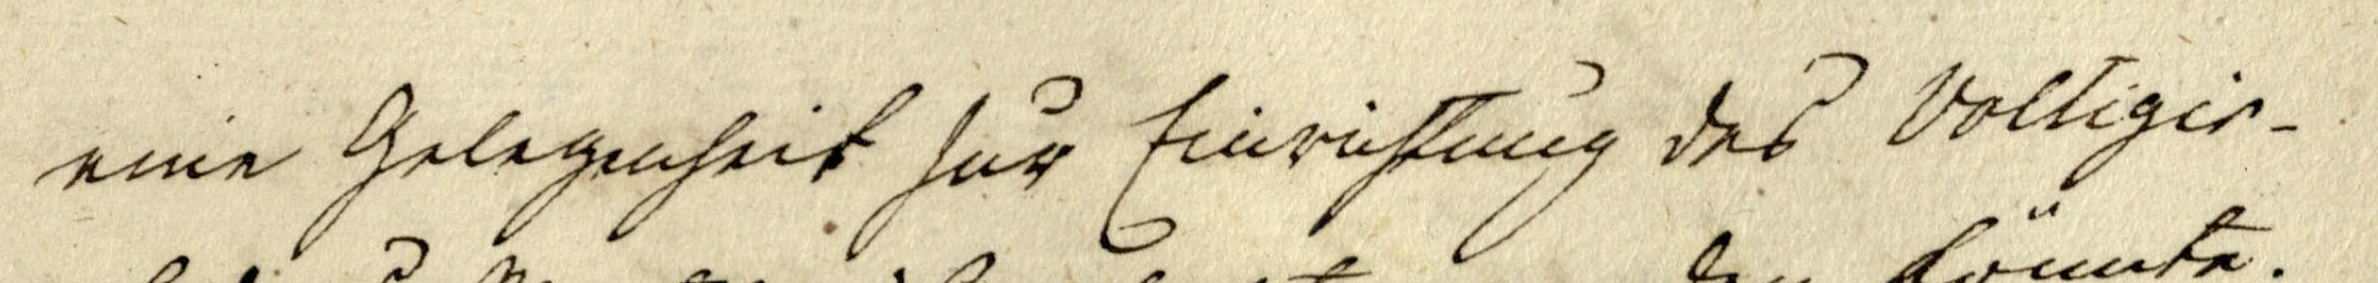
eine Gelegenheit zur Einrichtung des Voltigir¬
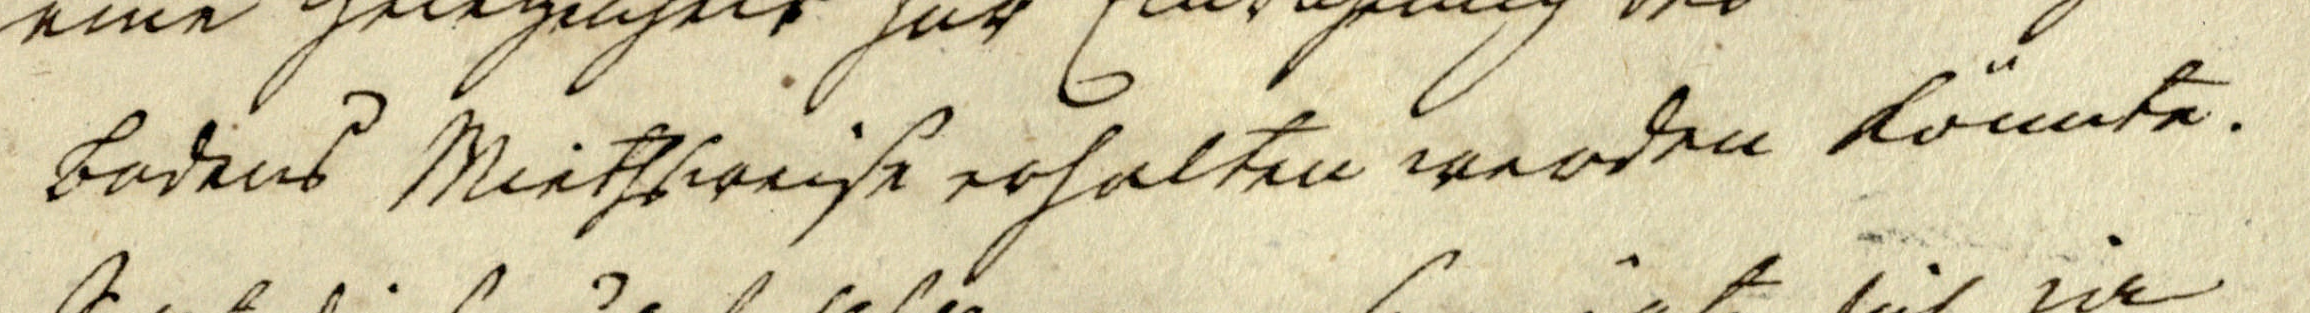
Bodens Miethsweise erhalten werden könnte.
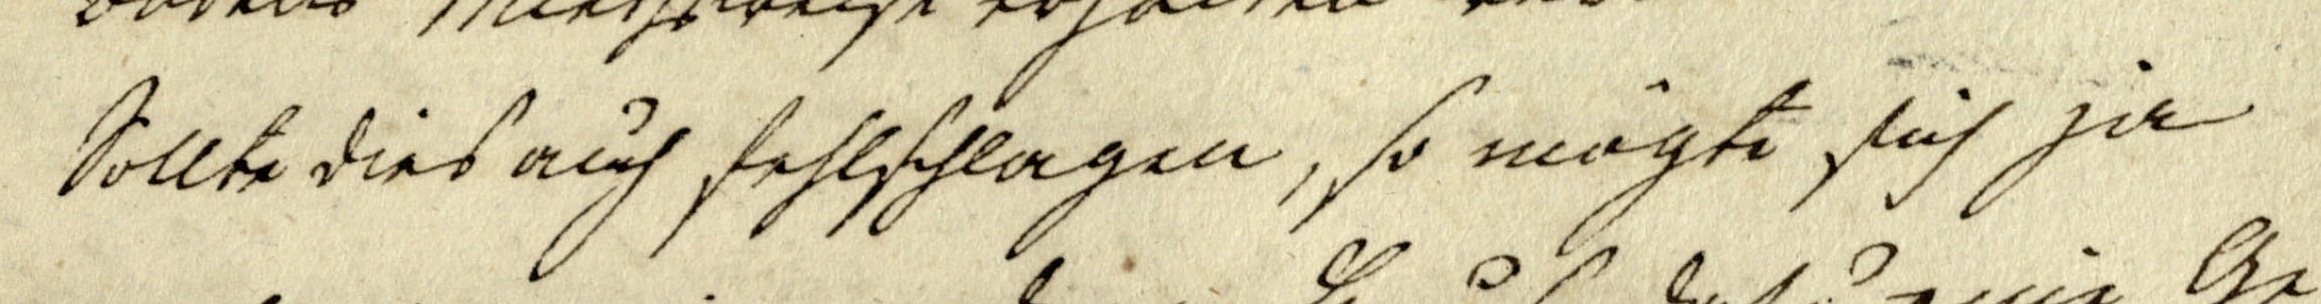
Sollte dies auch fehlschlagen, so mögte sich ja
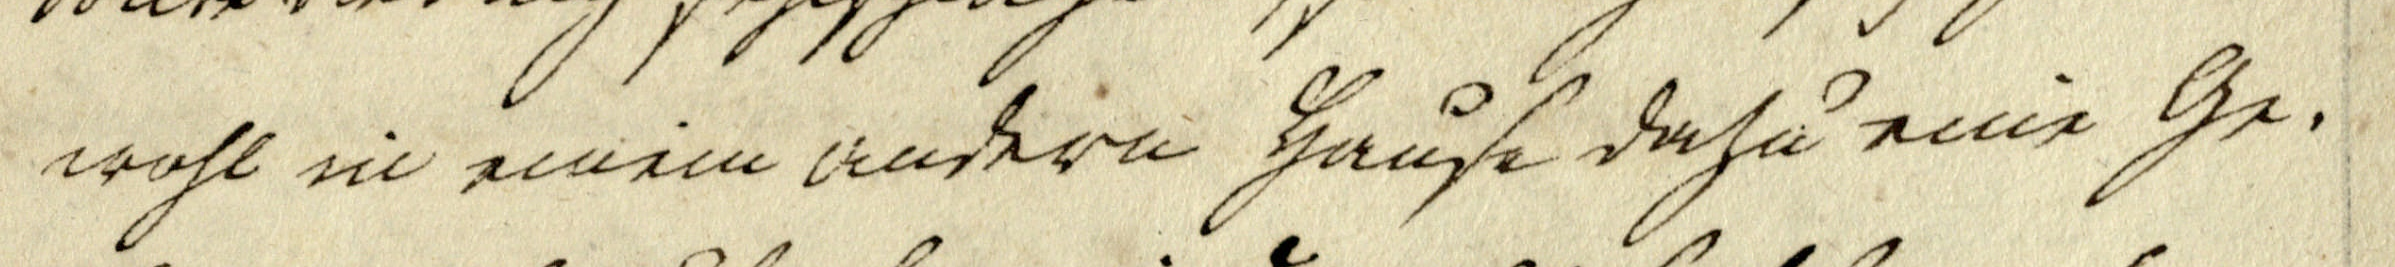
wohl in einem andern Hause dazu eine Ge¬
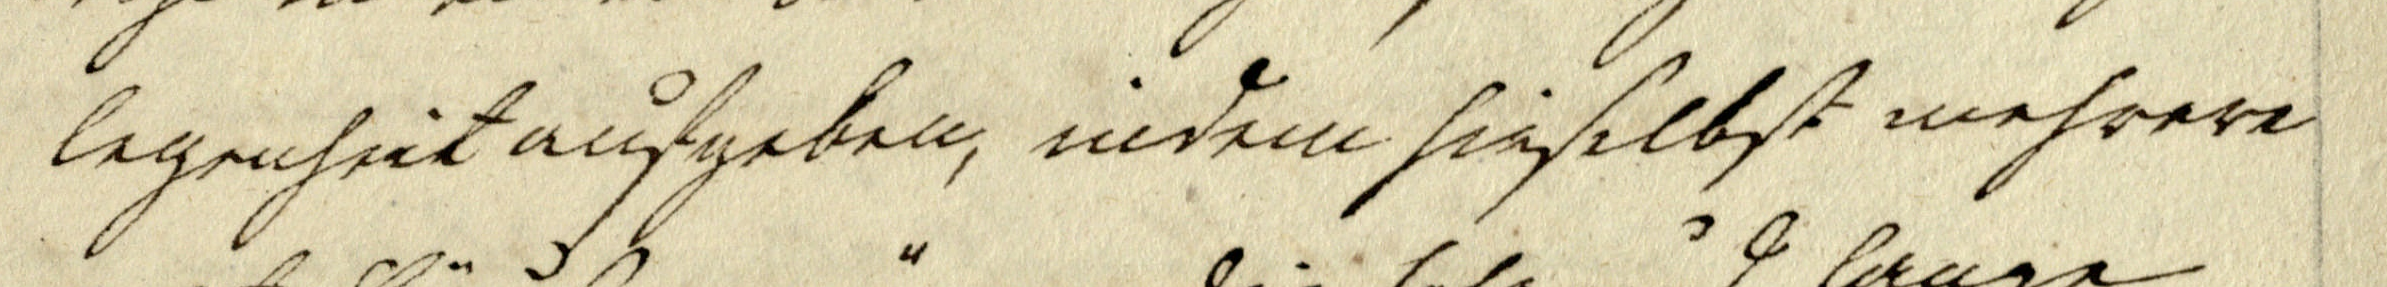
legenheit aufgeben, indem hieselbst mehrere
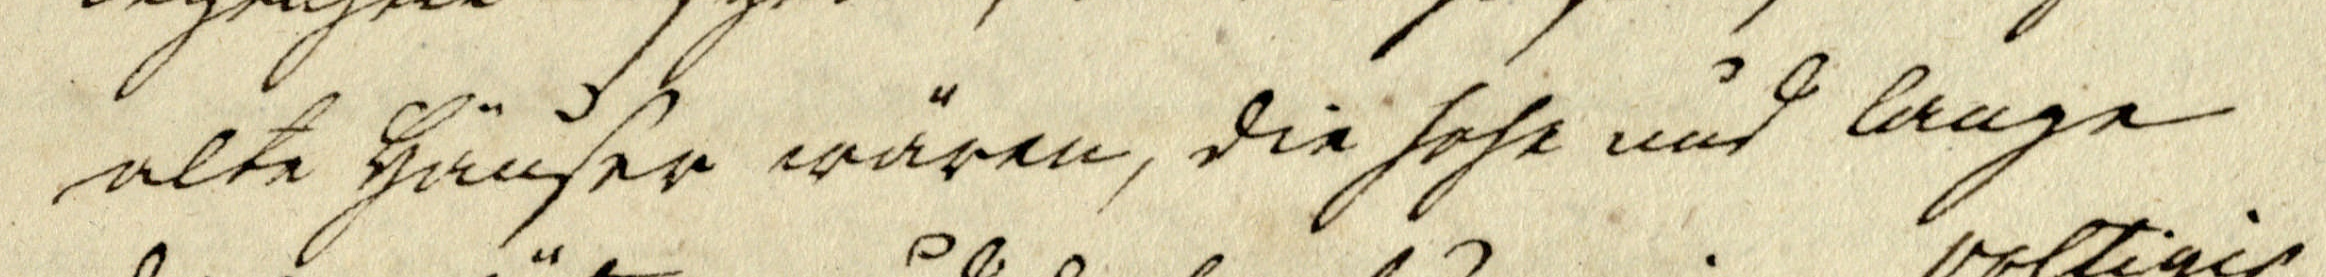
alte Häuser wären, die hohe und lange
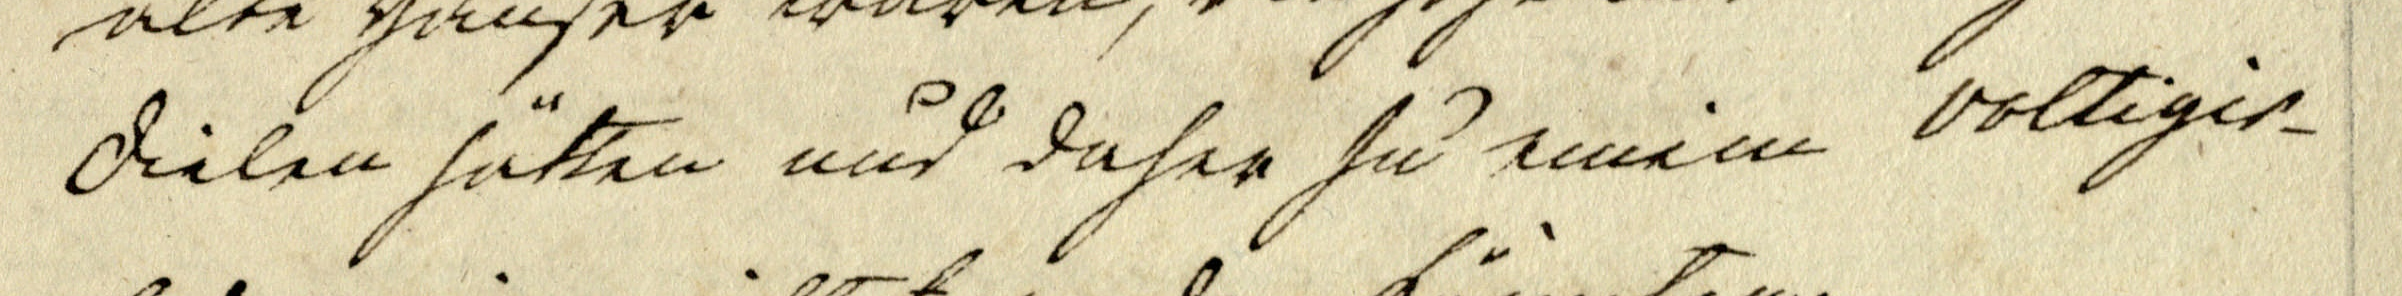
Dielen hätten und daher zu einem Voltigir¬
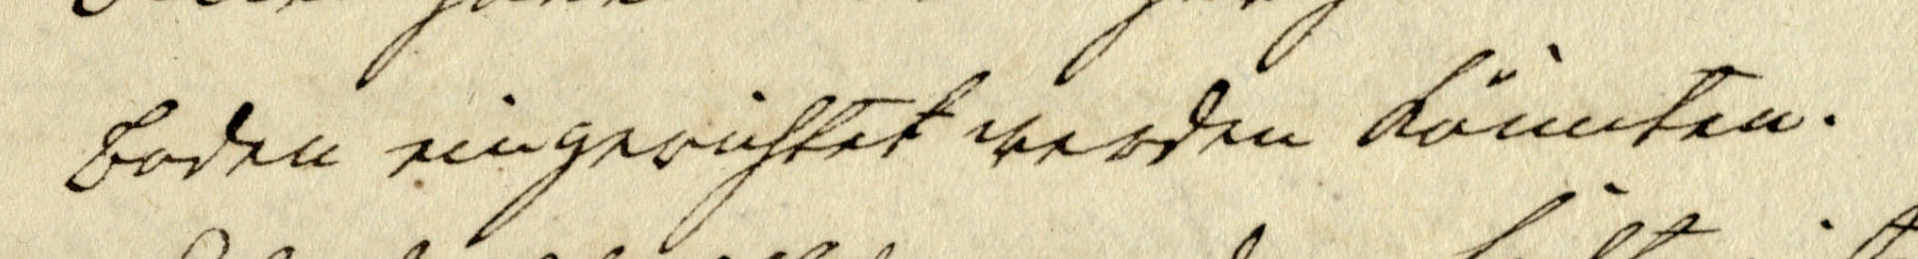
Boden eingerichtet werden könnten.
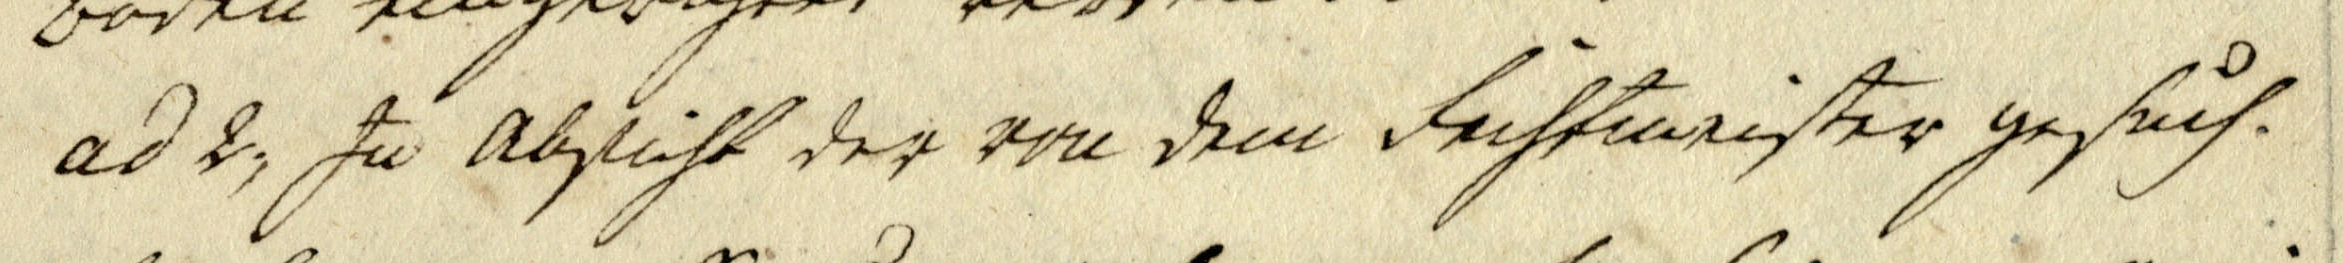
ad 2., In Absicht der von dem Fechtmeister gesuch¬
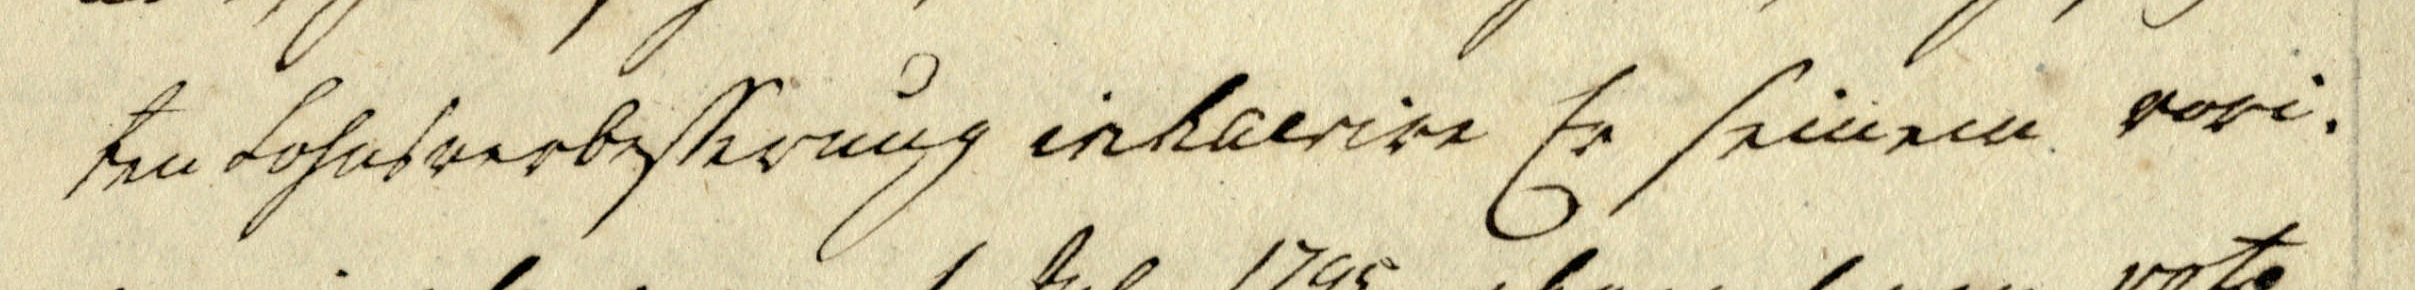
ten Lohnsverbesserung inhaerire Er seinem vori¬
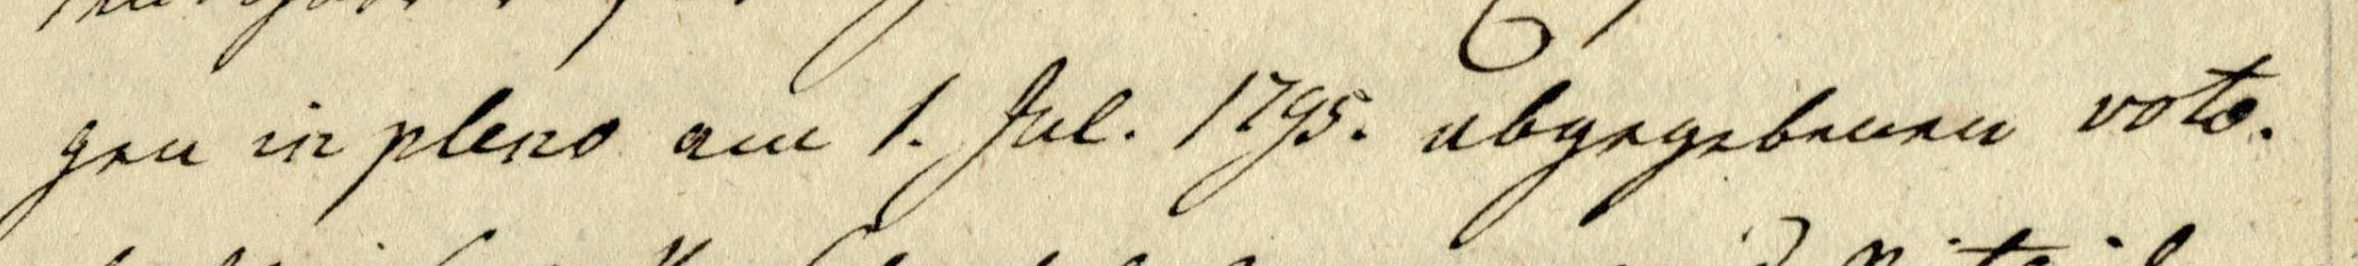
gen in pleno am 1. Jul. 1795. abgegebenen voto.
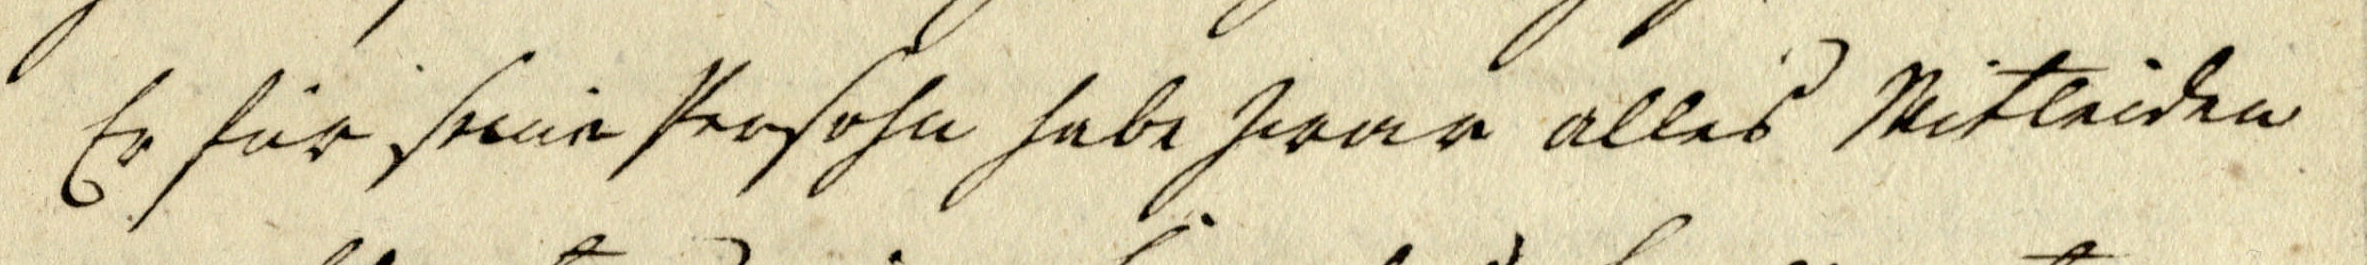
Er für seine Persohn habe zwar alles Mitleiden
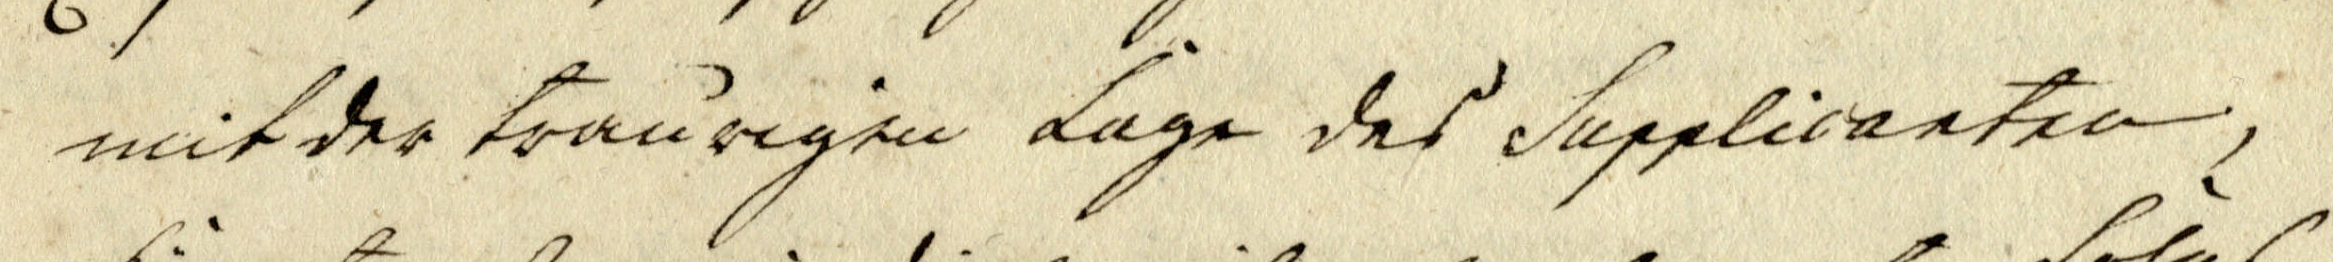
mit der traurigen Lage des Supplicanten,
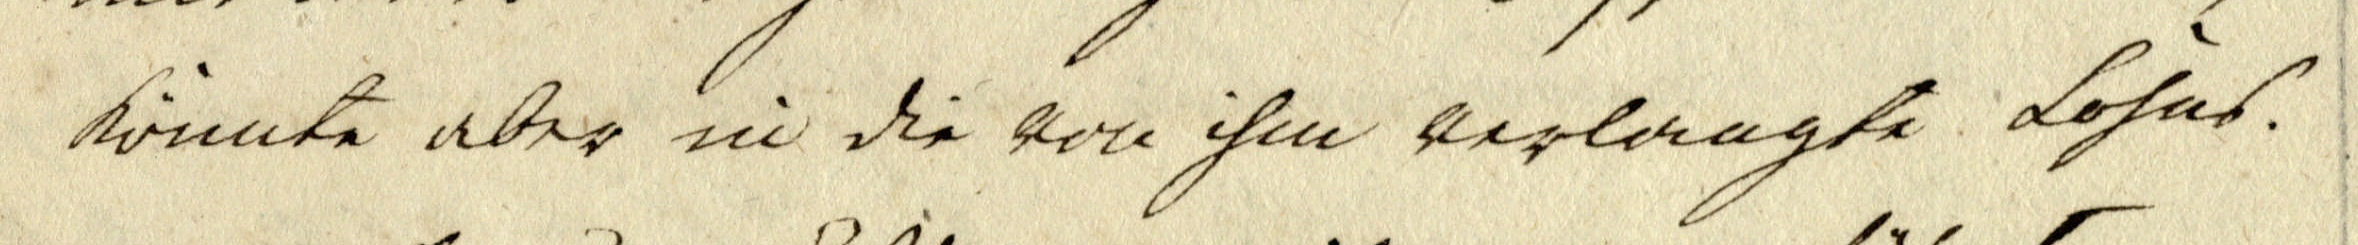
könnte aber in die von ihm verlangte Lohns¬
